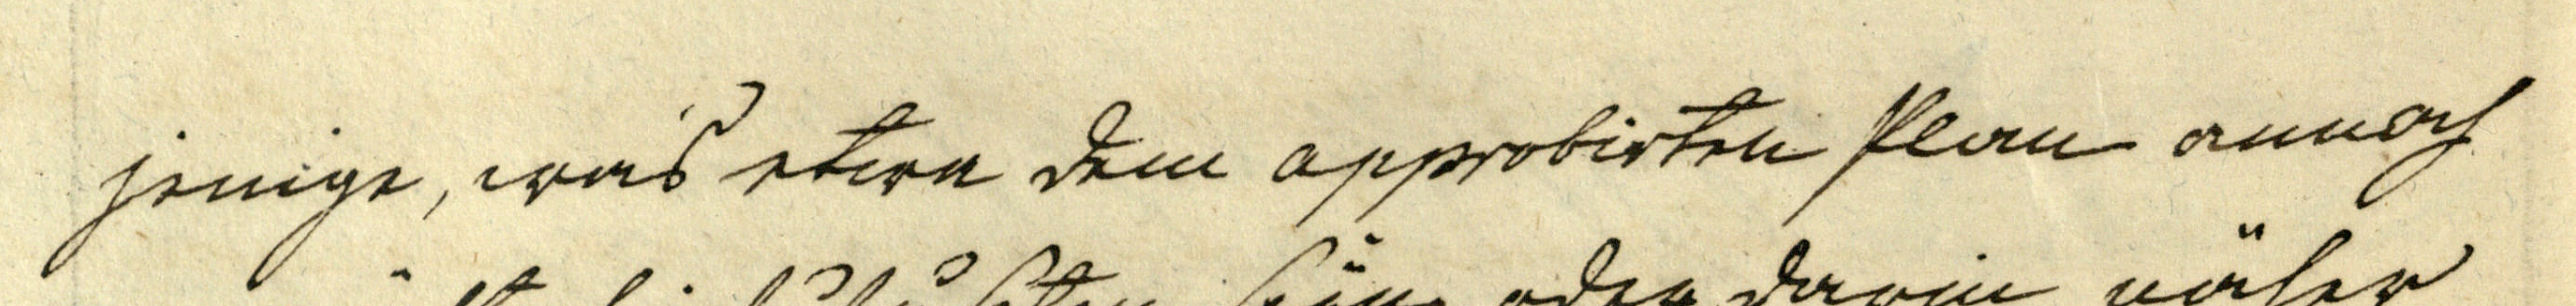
jenige, was etwa dem approbirten Plan annoch
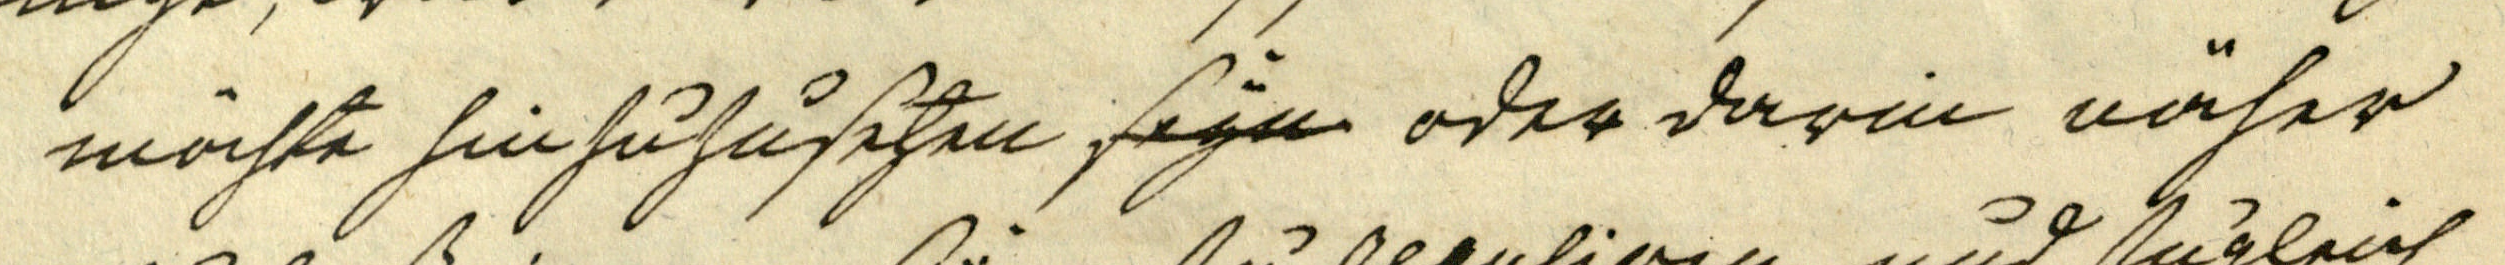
möchte hinzuzusetzen seÿn oder darin näher
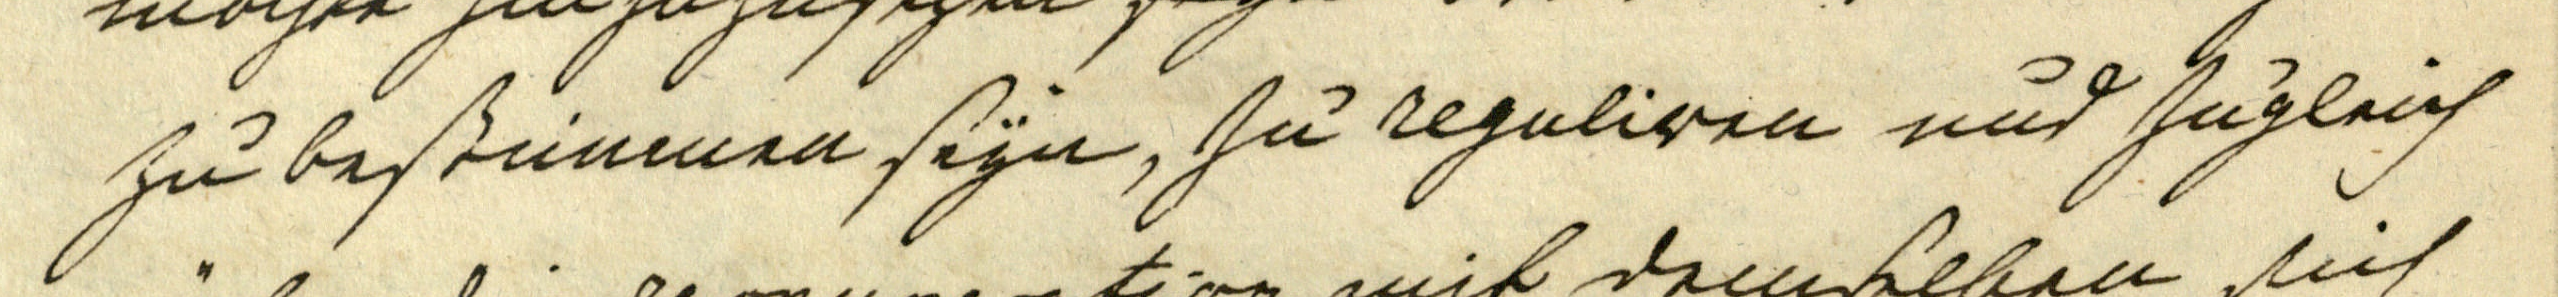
zu bestimmen seÿn, zu reguliren und zugleich
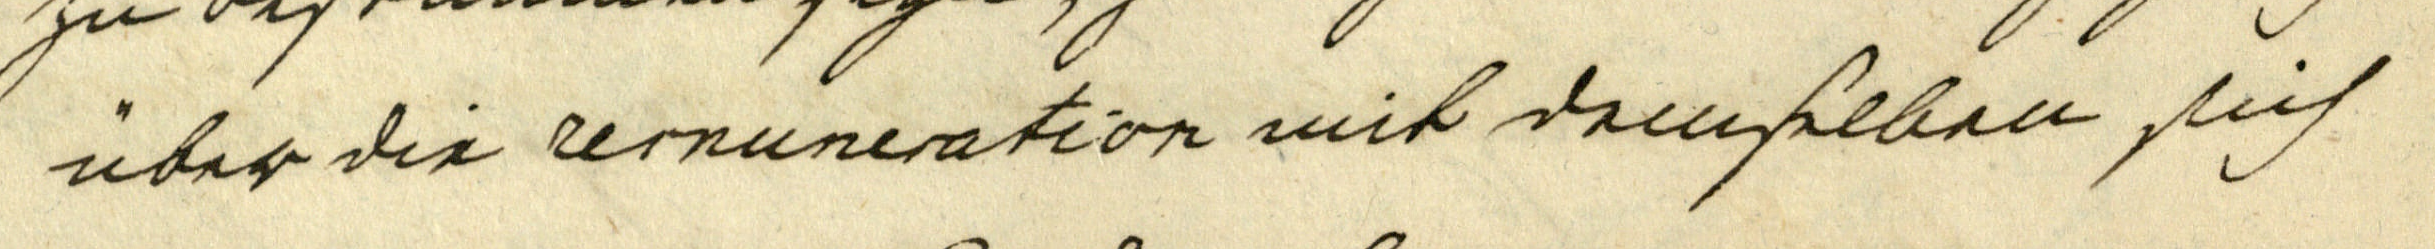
über die remuneration mit demselben sich
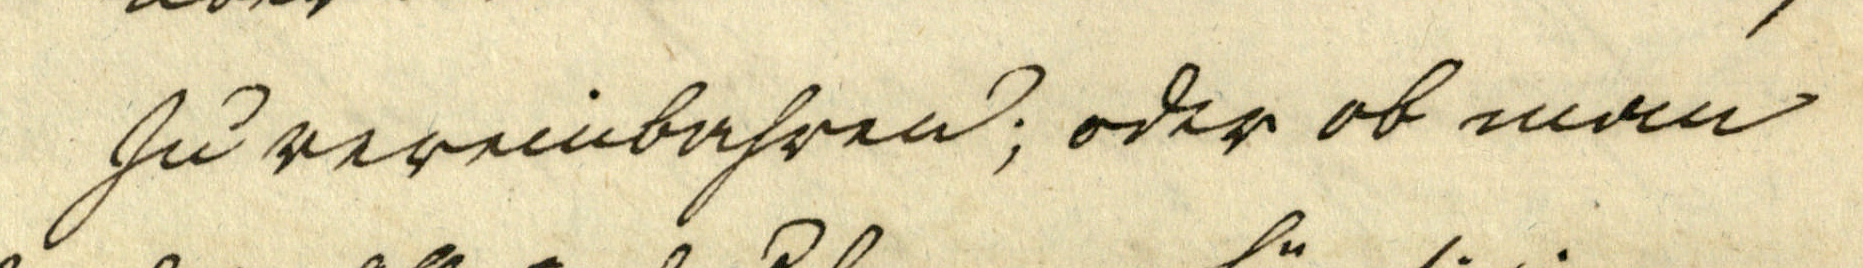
zu vereinbahren; oder ob man
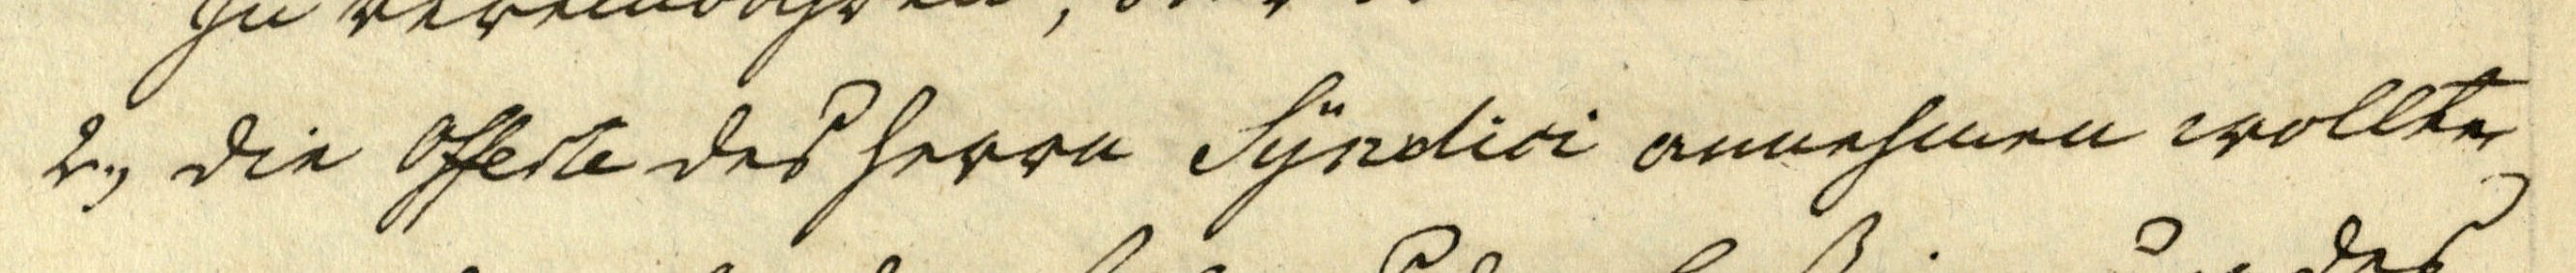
2., die Offerte des Herrn Sÿndici annehmen wollte,
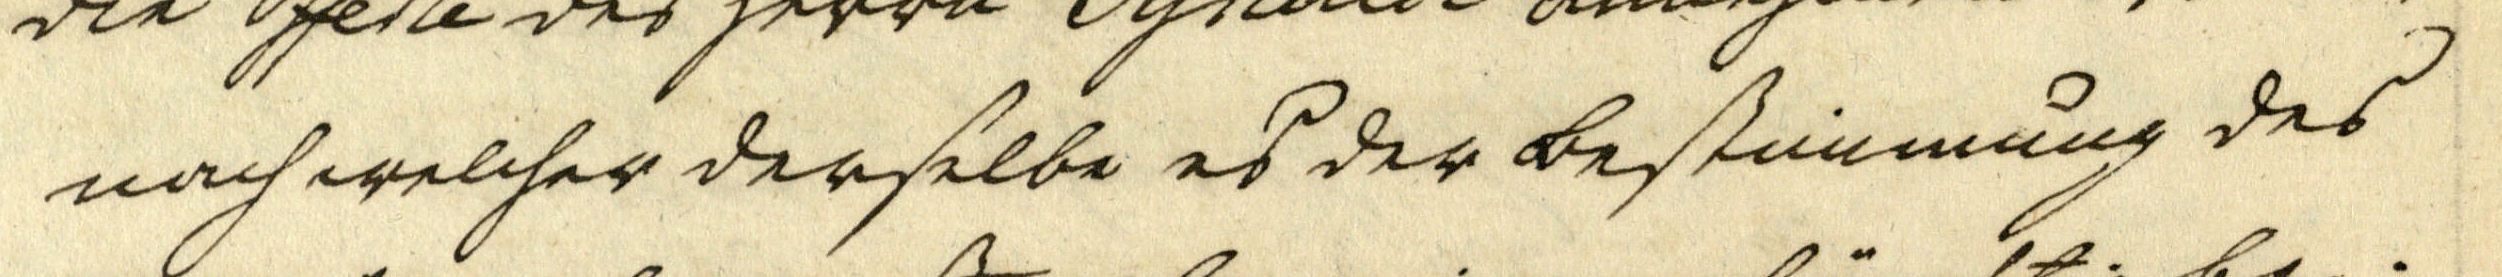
nach welcher derselbe es der Bestimmung des
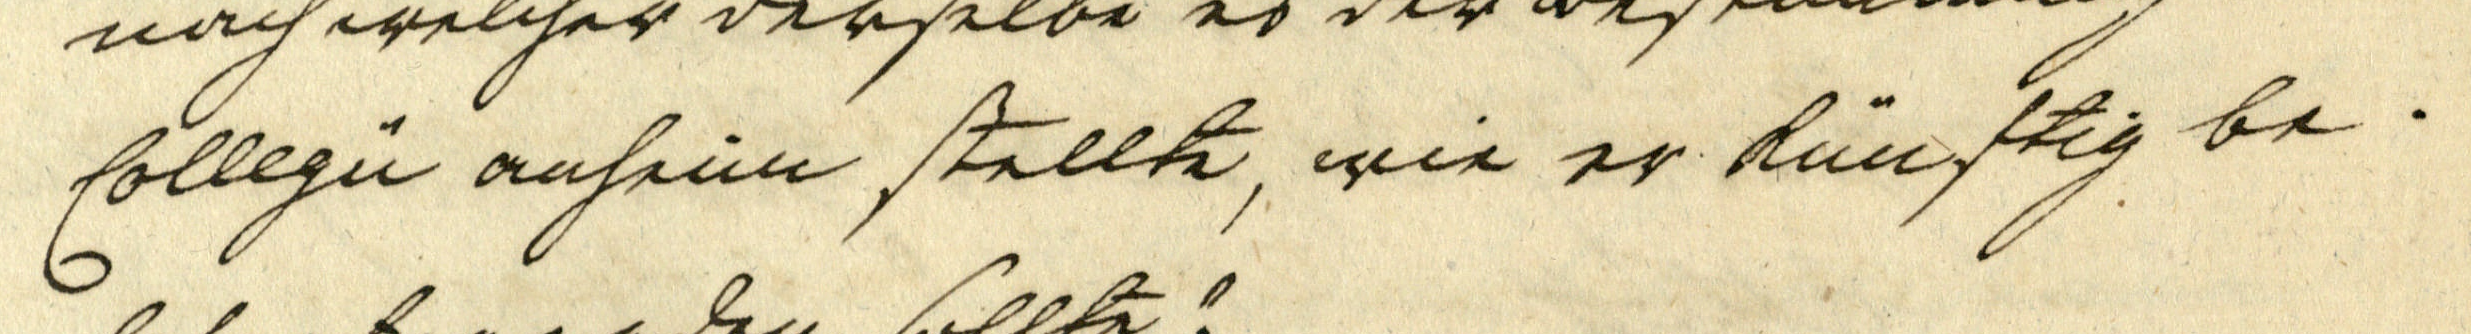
Collegii anheim stellte, wie er künftig be¬
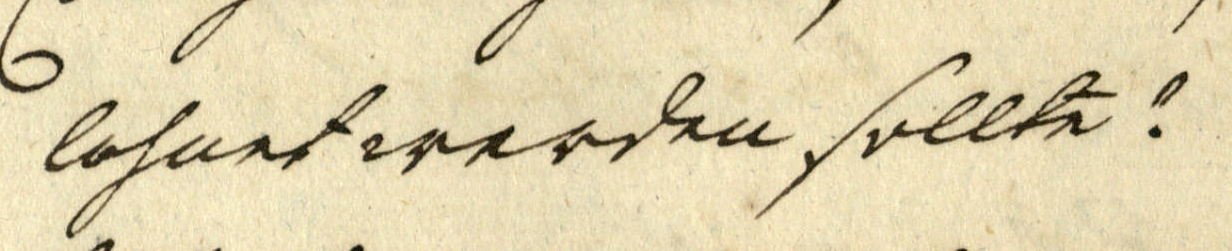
lohnet werden sollte?
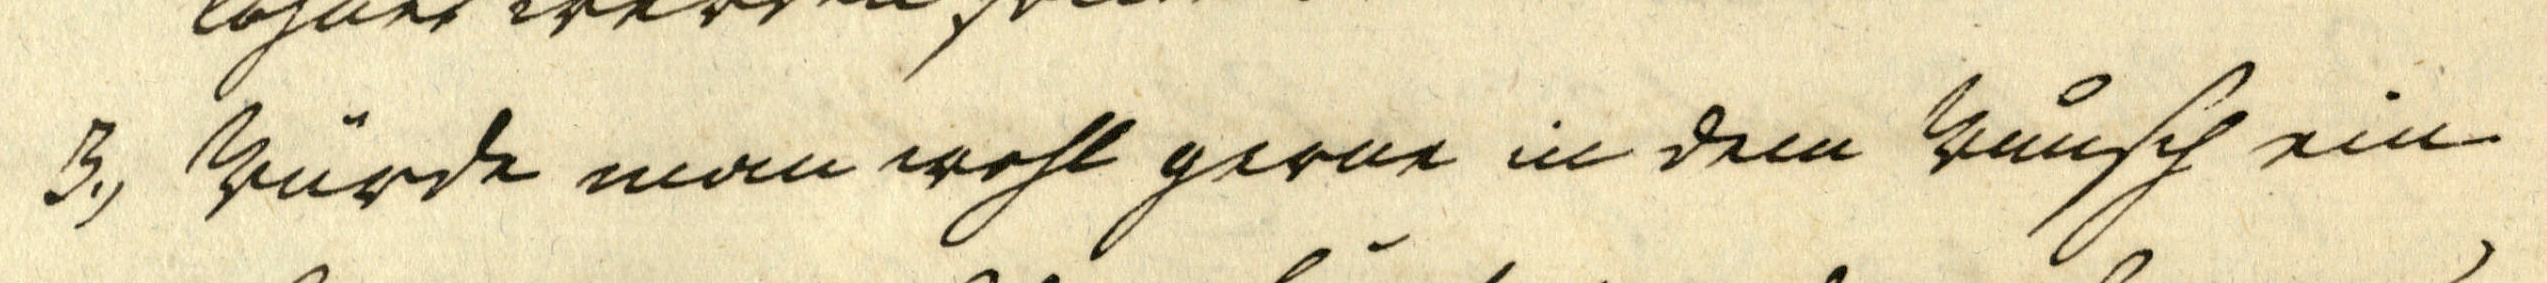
3., Würde man wohl gerne in dem Wunsch ein¬
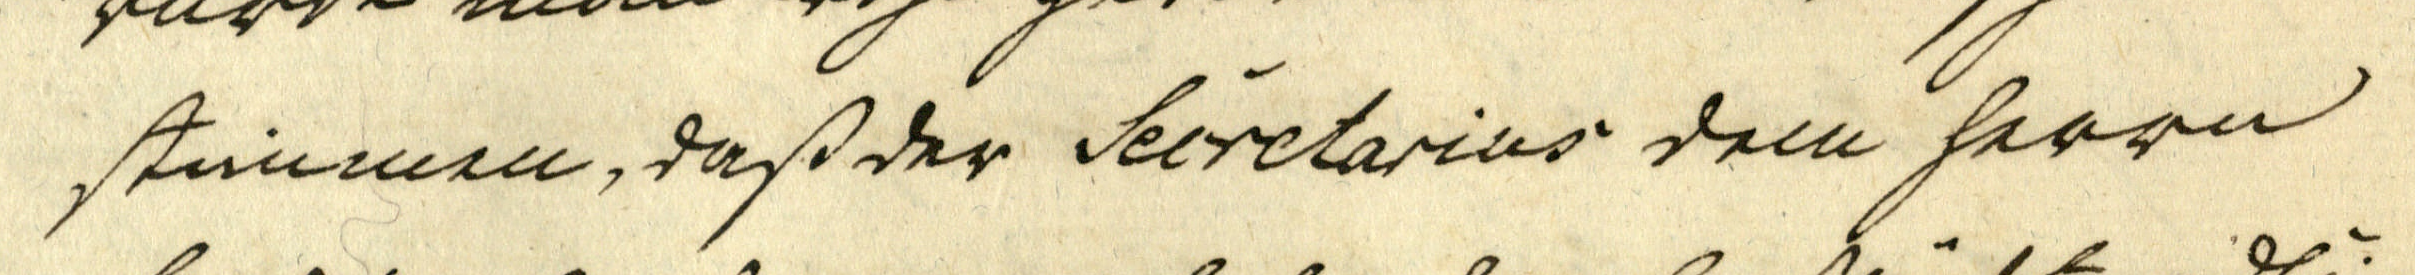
stimmen, daß der Secretarius dem Herrn
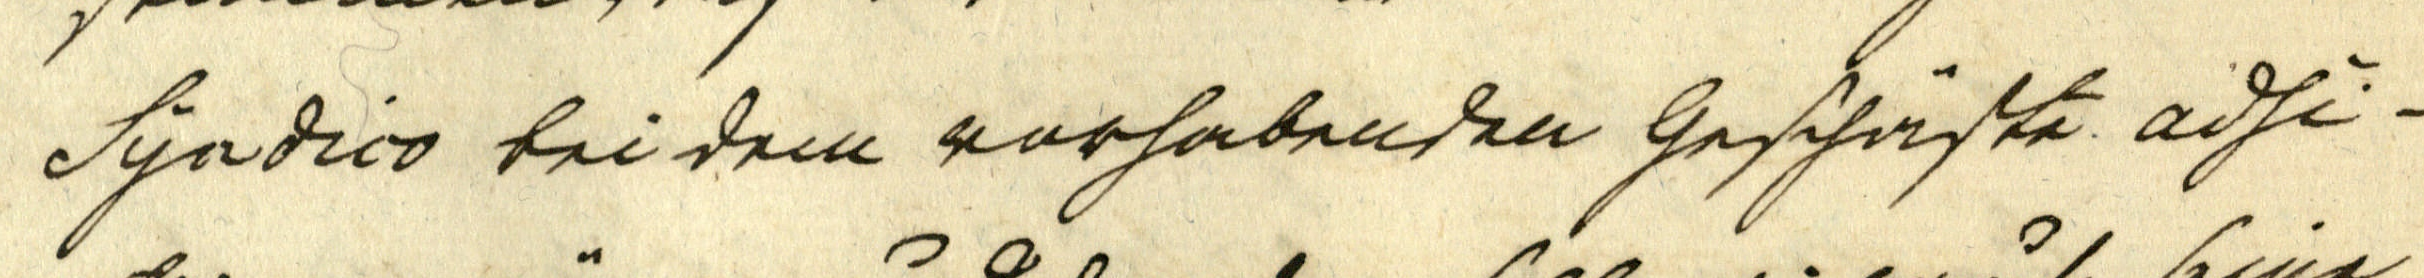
Sÿndico bei dem vorhabenden Geschäfte adhi¬
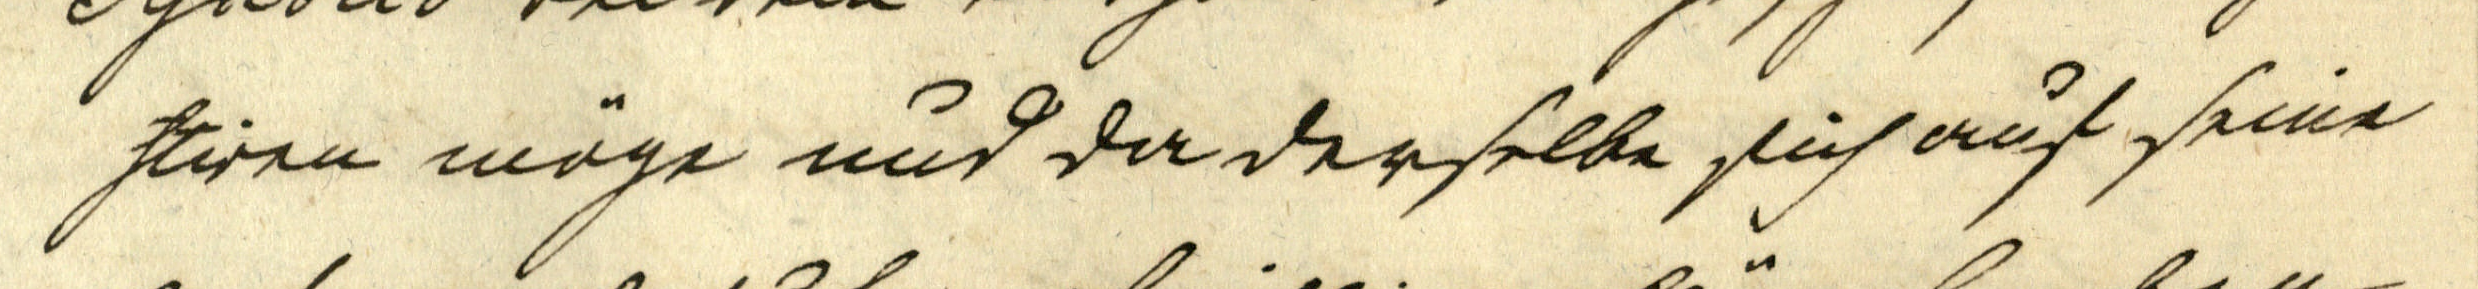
stiren möge und da derselbe sich auf seine
